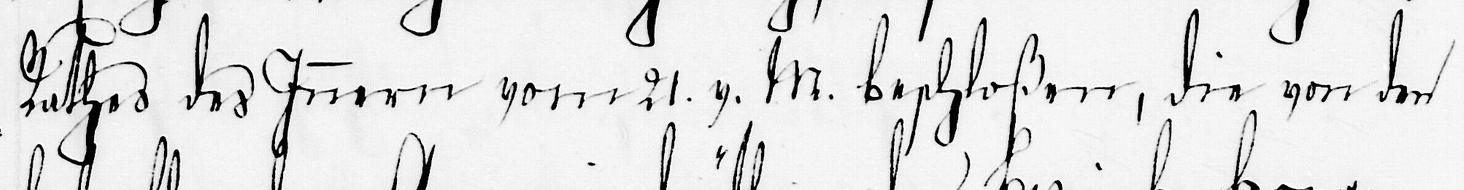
Rathes des Innern vom 21. v. M. beschloßen, die von den
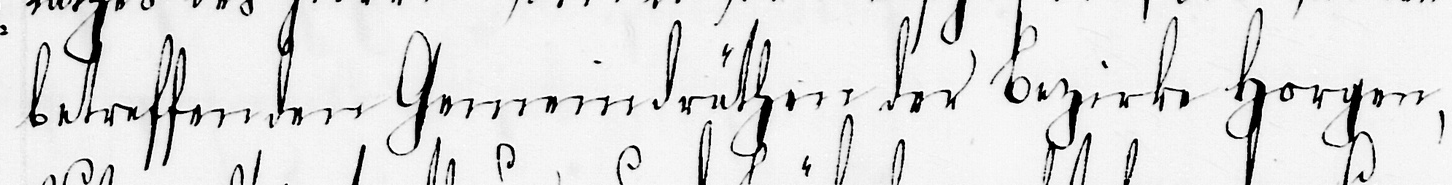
betreffenden Gemeindräthen der Bezirke Horgen,
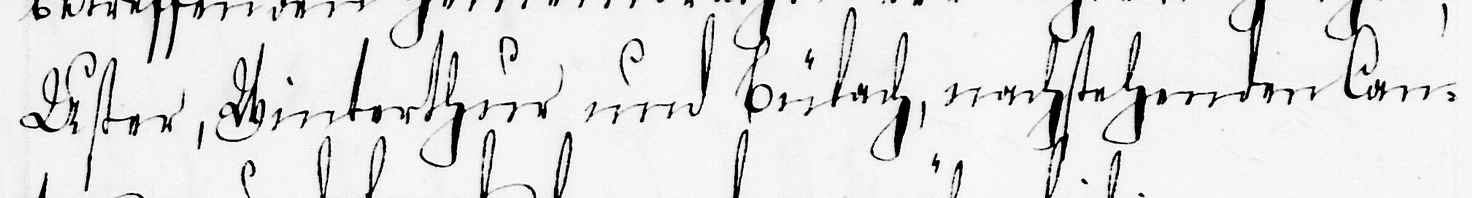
Uster, Winterthur und Bülach, nachstehenden Can¬
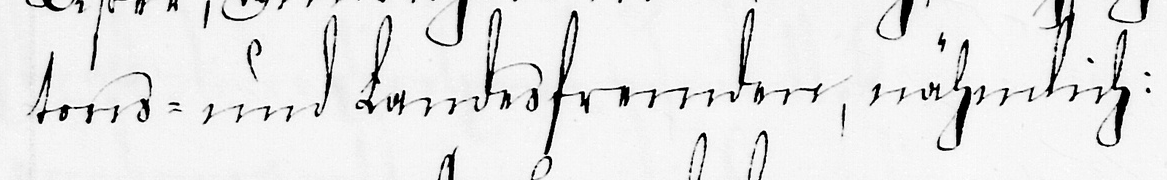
tons- und Landesfremden, nähmlich:
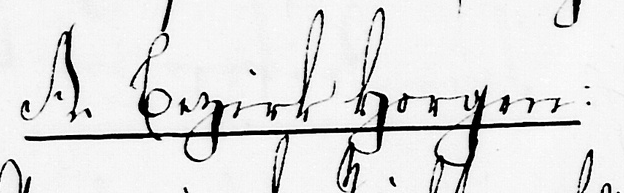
A. Bezirk Horgen:
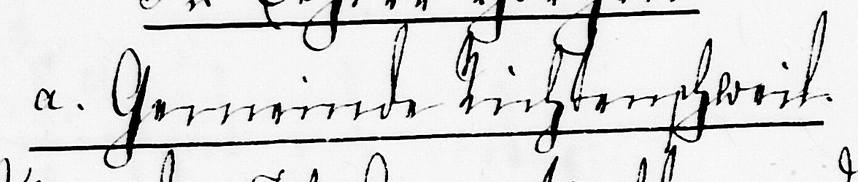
a. Gemeinde Richterschweil.
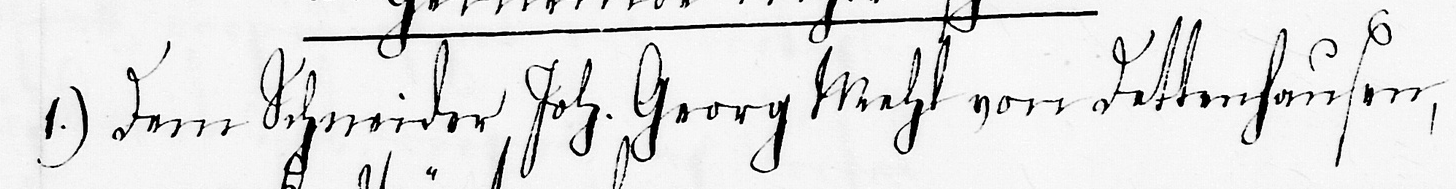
1.) Dem Schneider Joh. Georg Mehl von Dettenhausen,
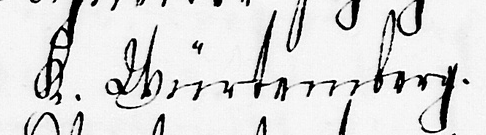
K. Würtemberg.
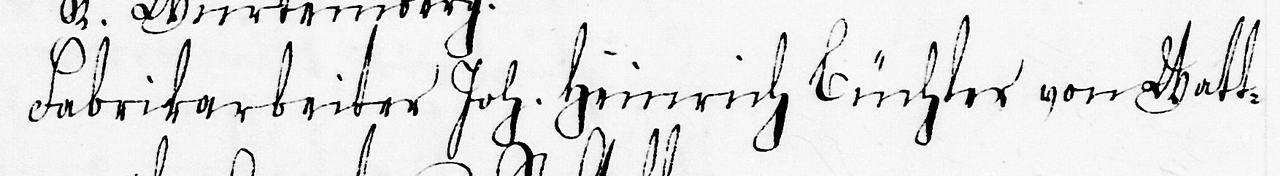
abrikarbeiter Joh. Heinrich Büchler von Watt¬
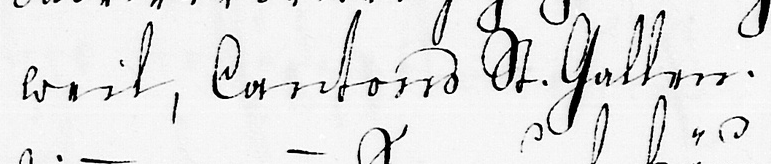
weil, Cantons St. Gallen.
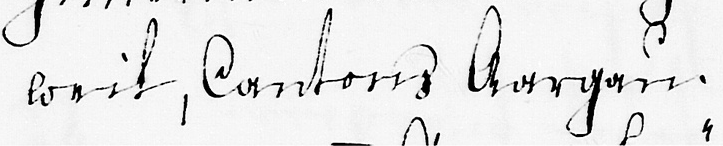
weil, Cantons Aargau.
